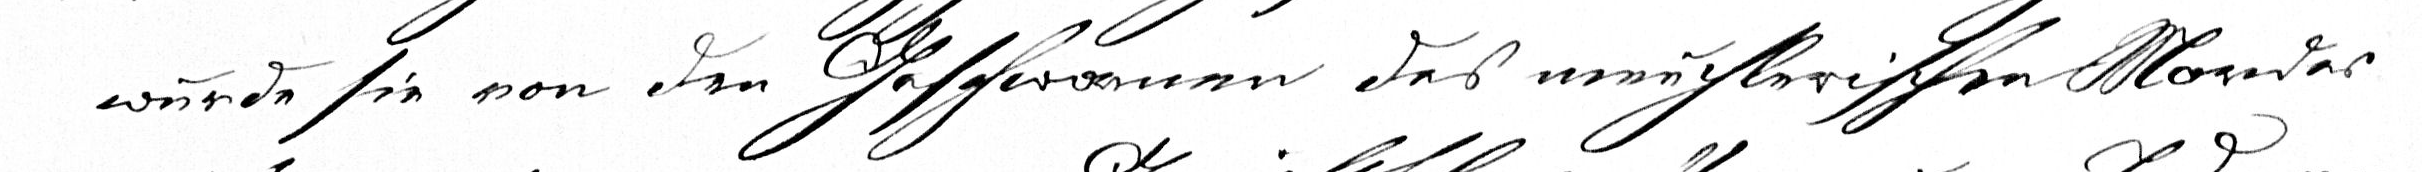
wurde sie von den Geschwornen des meuchlerischen Mordes
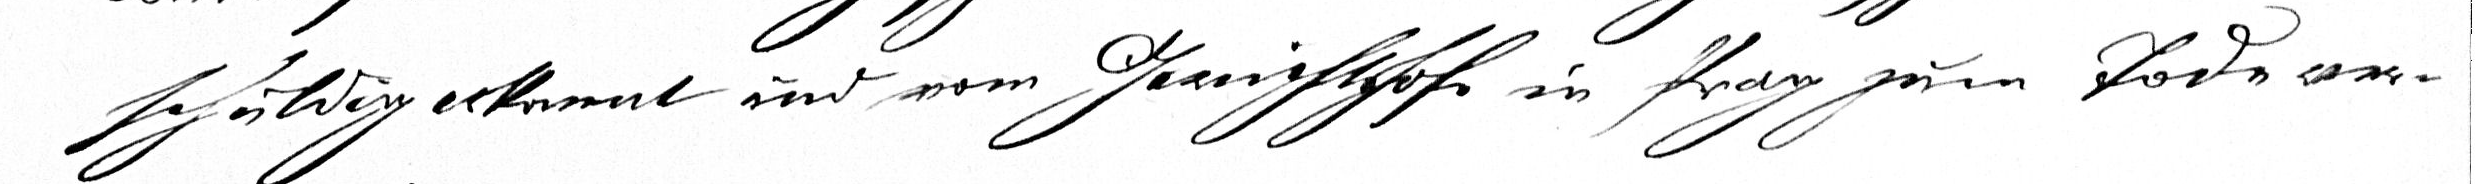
schuldig erkannt und vom Gerichthofe in Prag zum Tode ver¬
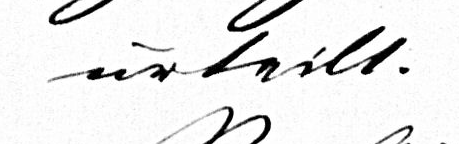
urteilt.
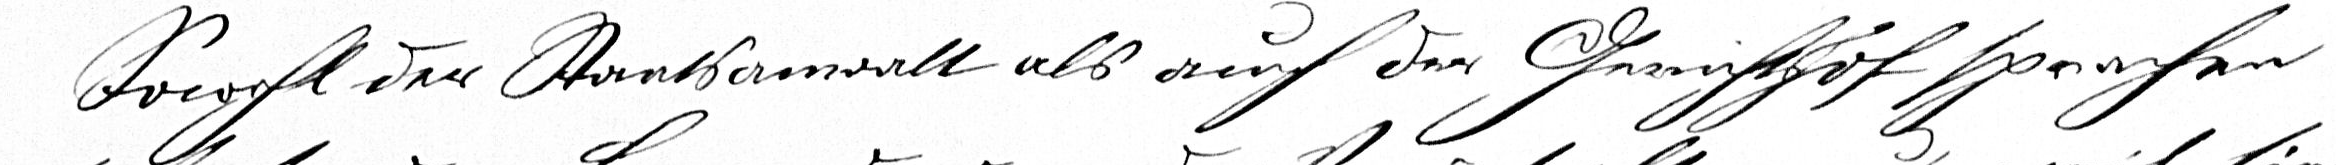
Sowohl der Staatsanwalt als auch der Gerichtshof sprachen
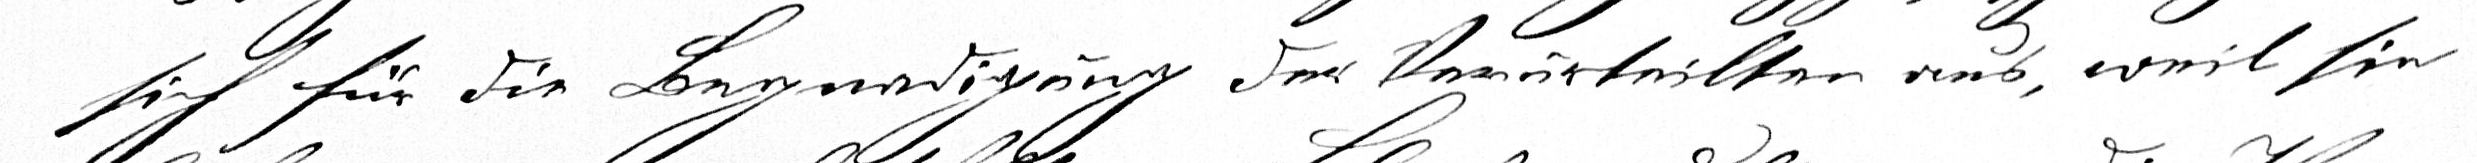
sich für die Begnadigung der Verurteilten aus, weil sie
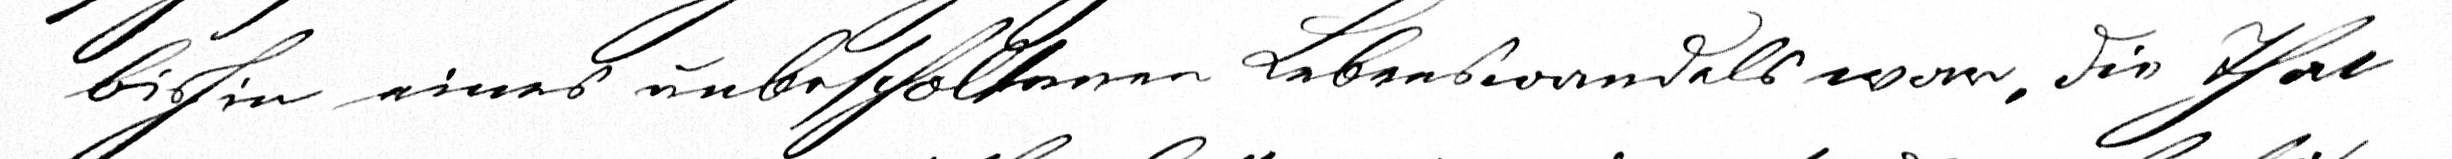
biß in eines unbescholtenen Lebenswandels war, die That
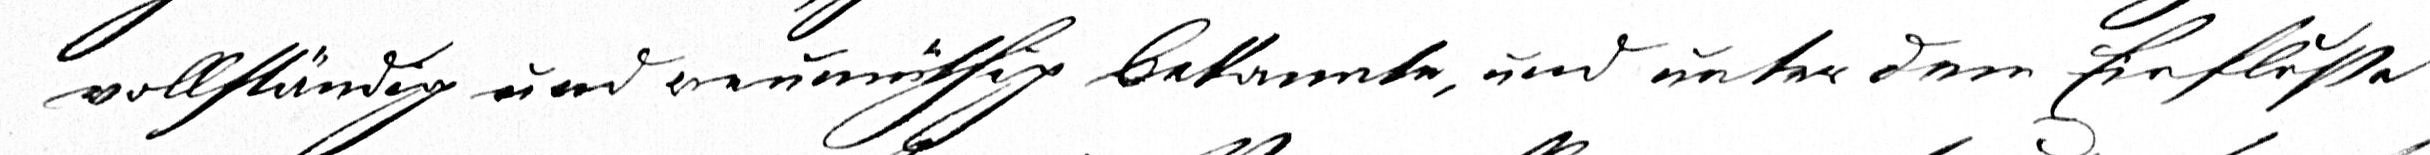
vollständig und reumüthig bekannte, und unter dem Einfluße
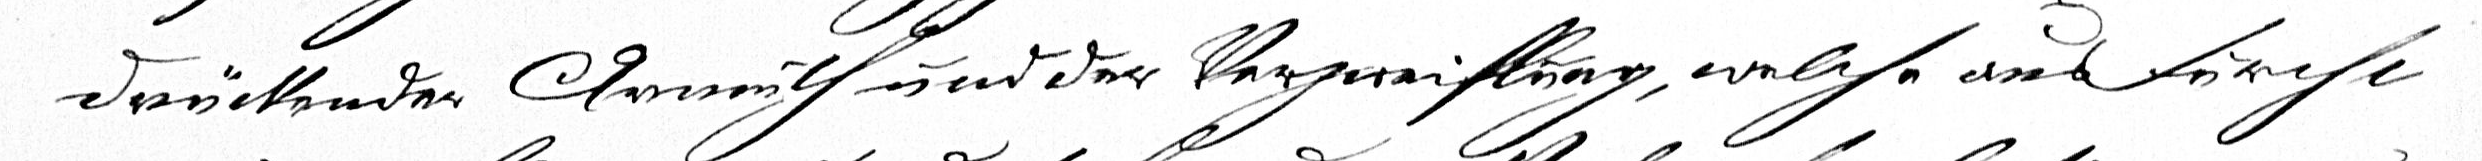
Drückender xx und der Verzweiflung, welche aus Furcht
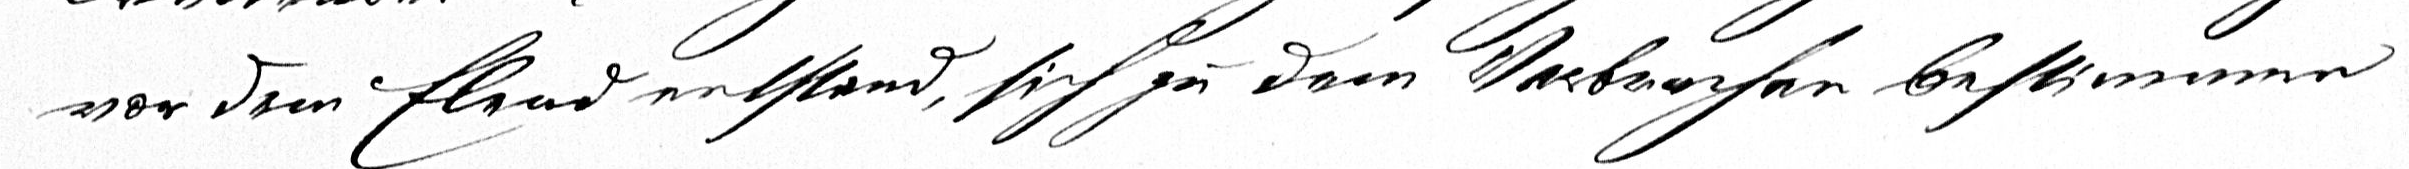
vor dem Elend entstand, sich zu dem Verbrochen bestimmen
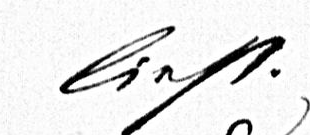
ließ.
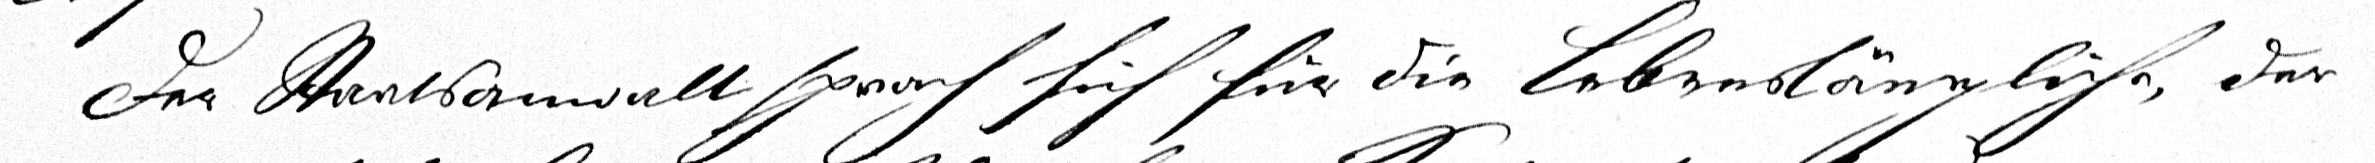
Der Staatsanwalt sprach sich für die Lebenslängliche, der
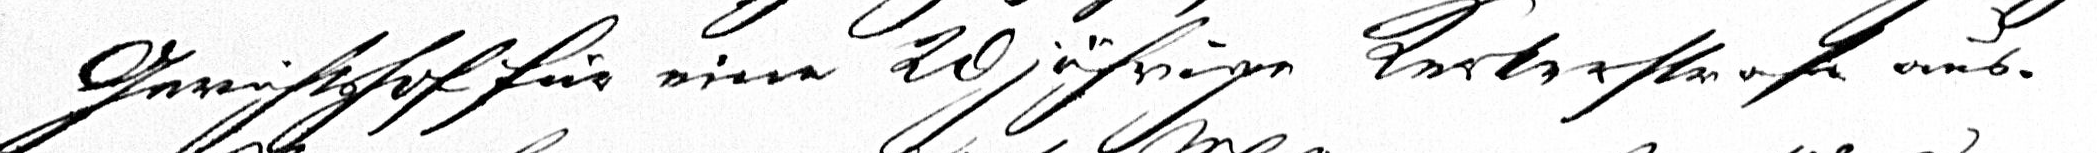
Gerichtshof für eine 20jährige Kerkerstrafe aus.
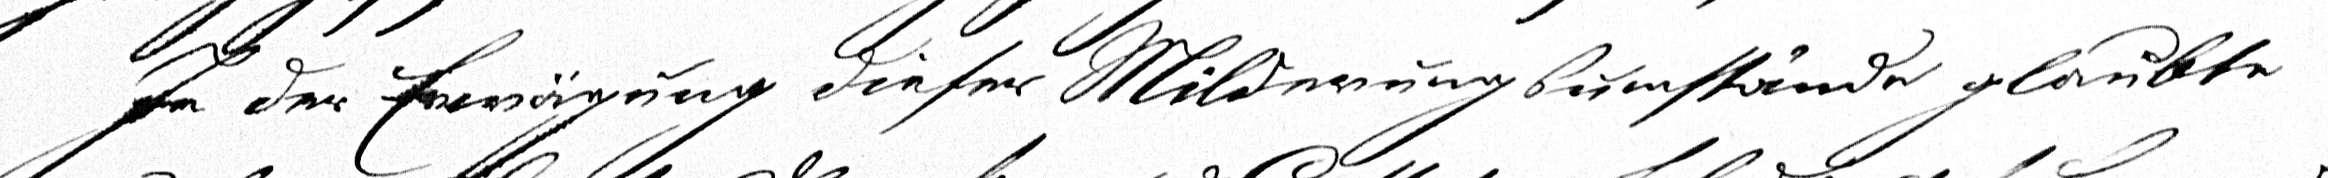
In der Erwägung dieser Milderungsumstände glaubte
